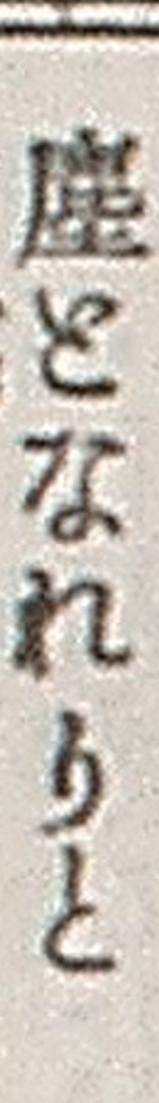塵となれりと
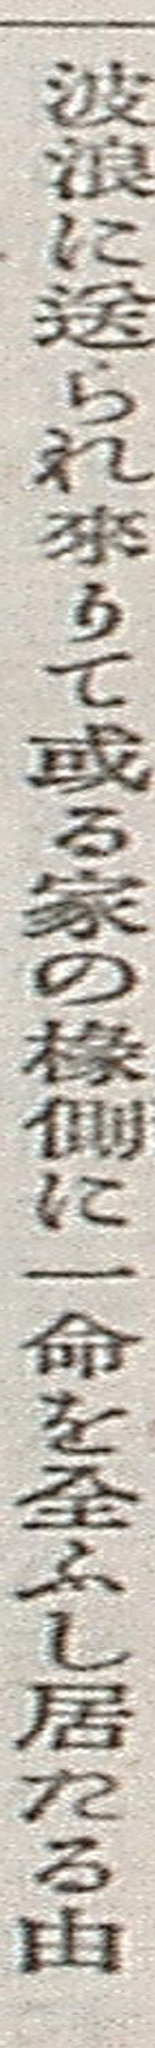波浪に送られ来りて或る家の椽側に一命を全ふし居たる由
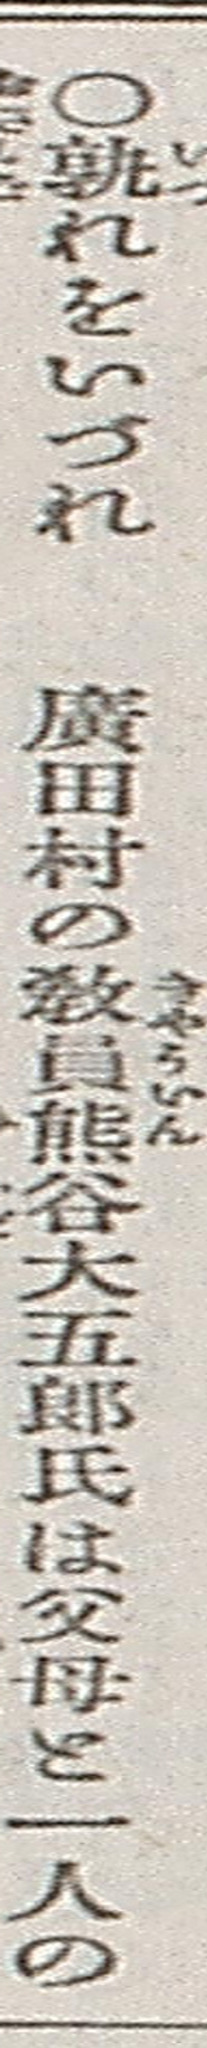○孰れをいづれ広田村の教員熊谷大五郎氏は父母と一人の
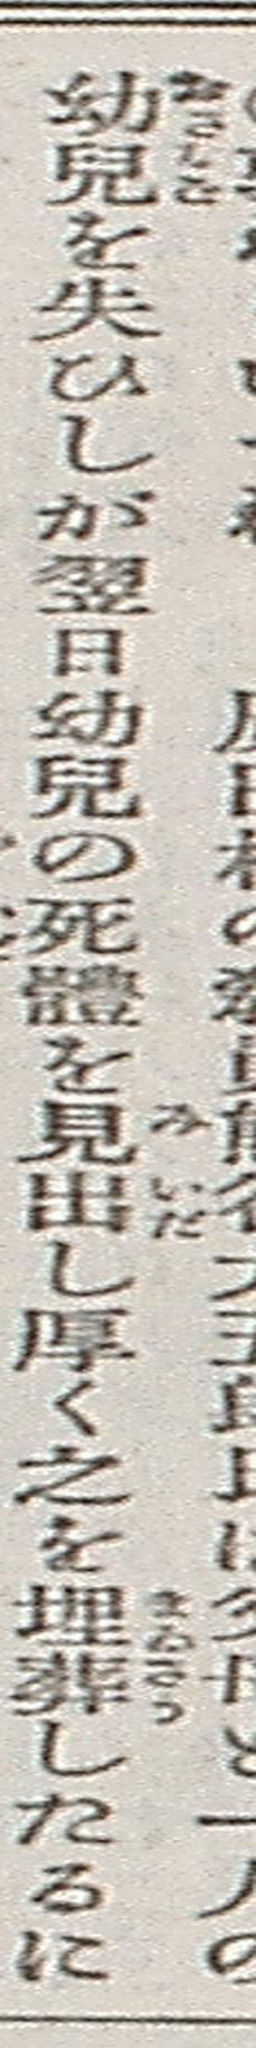幼児を失ひしが翌日幼児の死体を身出し厚く之を埋葬したるに
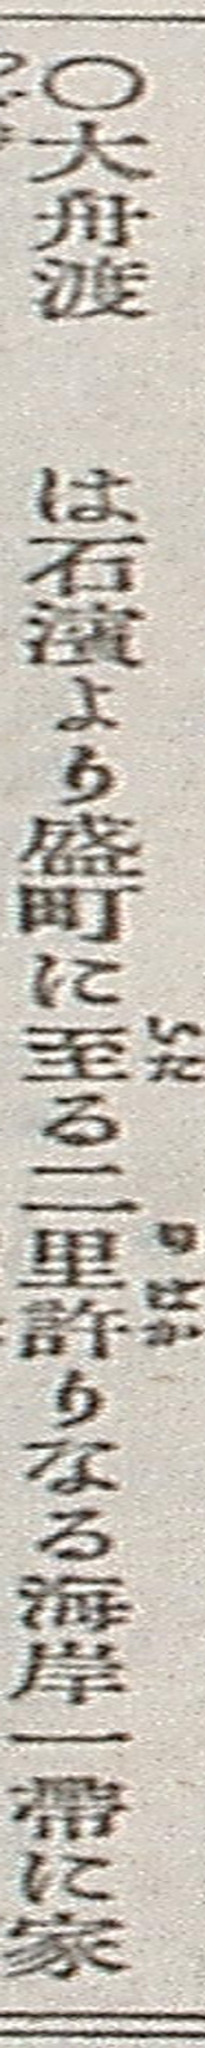○大舟渡は石浜より盛町に至る二里許りなる海岸一帯に家
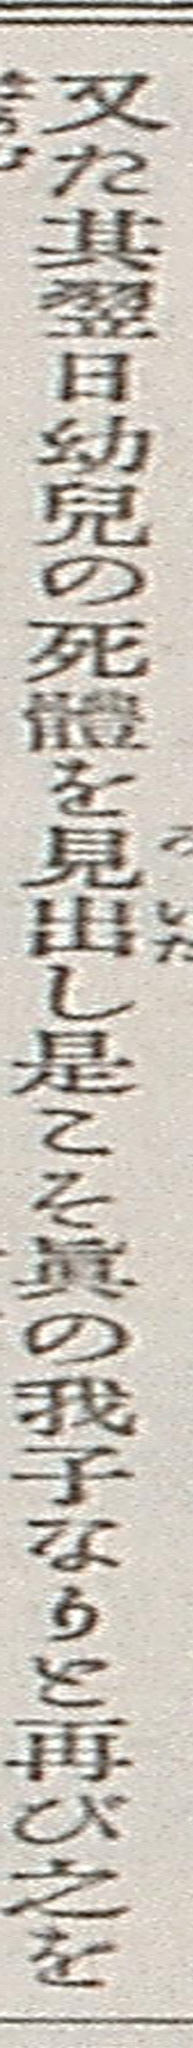又た其翌日幼児の死体を見出し是こそ真の我子なりと再び之を
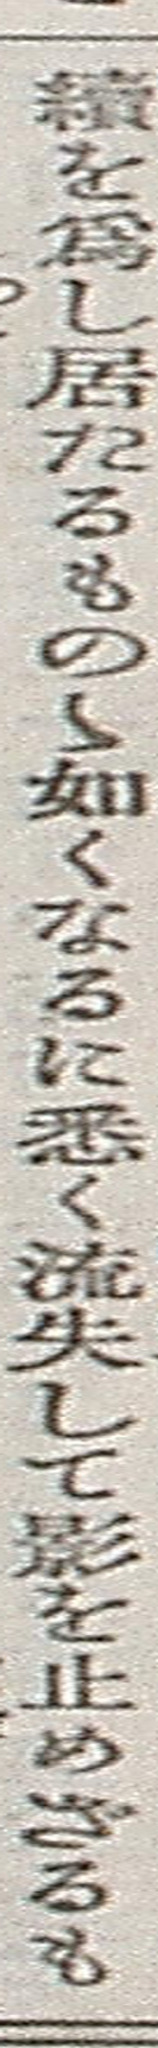続を為し居たるものゝ如くなるに悉く流失して影を止めざるも
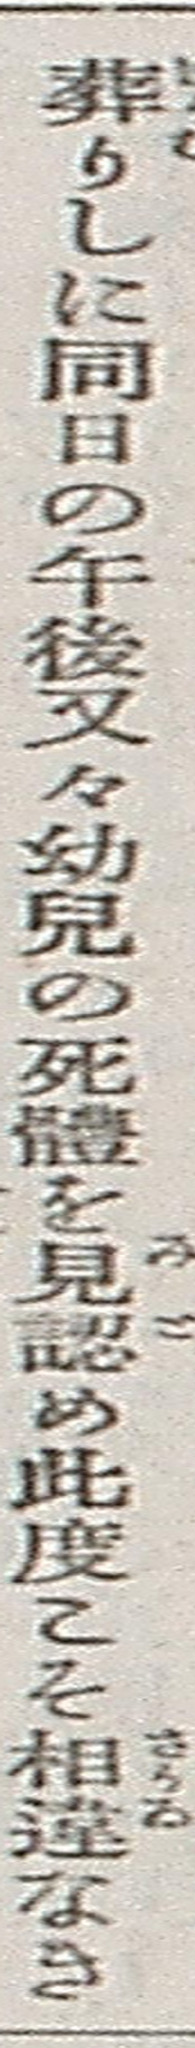葬りしに同日の午後又々幼児の死体を見認め此度こそ相違なき
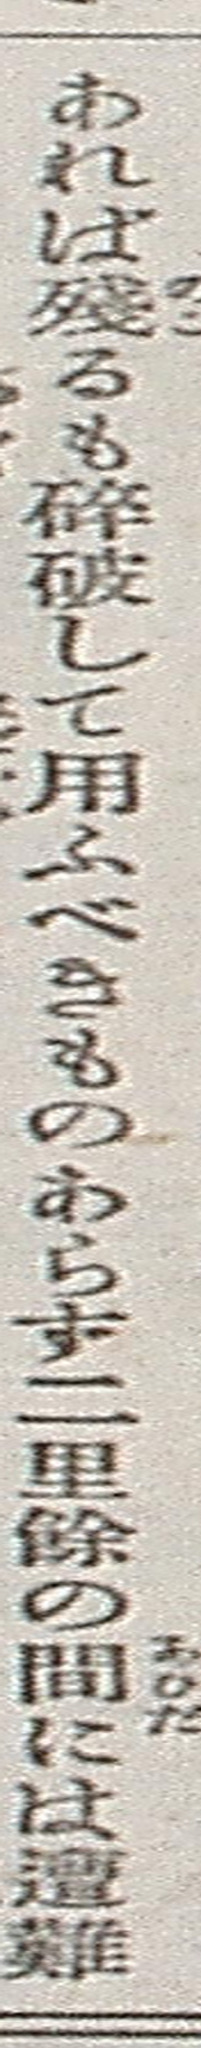あれば残るも碎破して用ふべきものあらず二里余の間には遭難
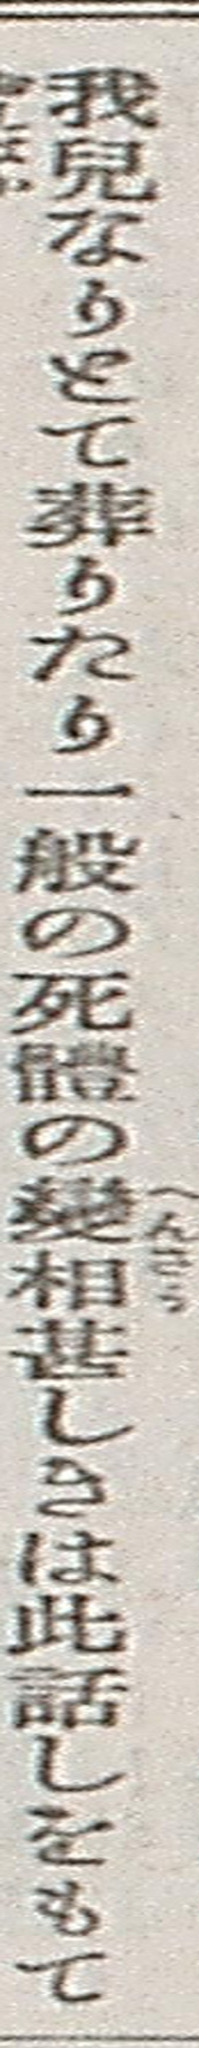我児なりとて葬りたり一般の死体の変相甚しきは此話しをもて
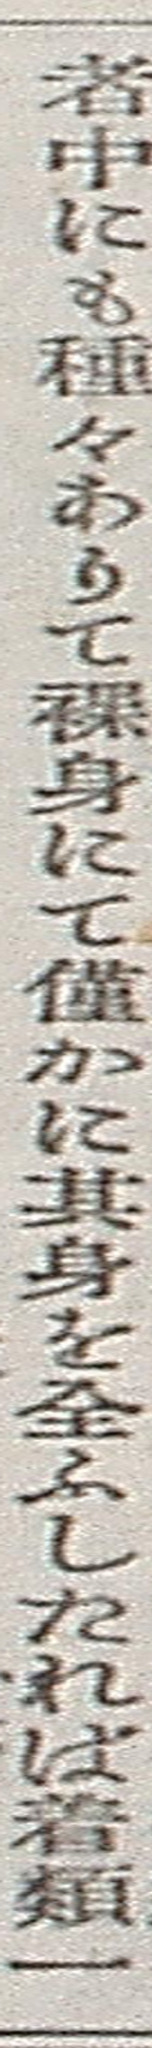者中にも種々ありて裸身にて僅かに其身を全ふしたれば着類一
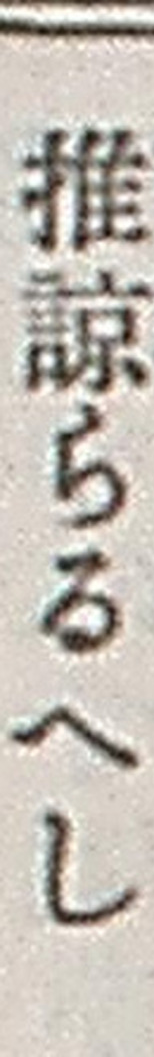推諒らるへし
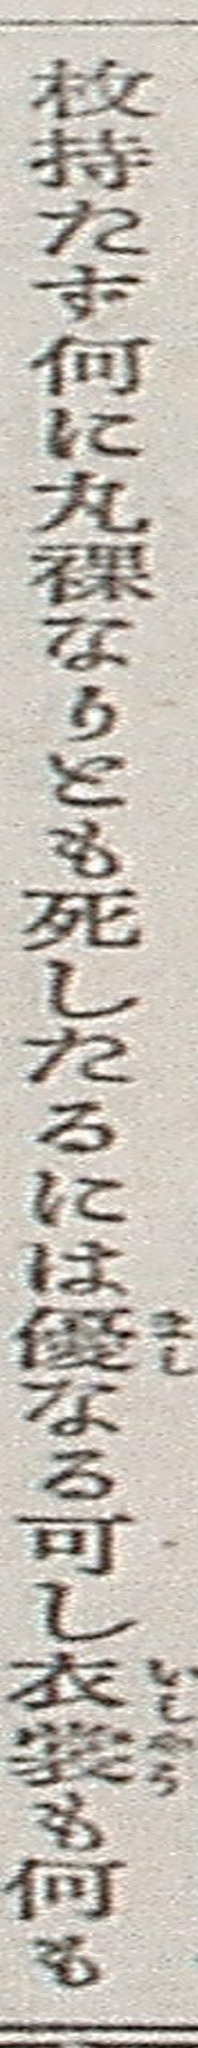枚持たず何に丸裸なりとも死したるには優なる可し衣装も何も

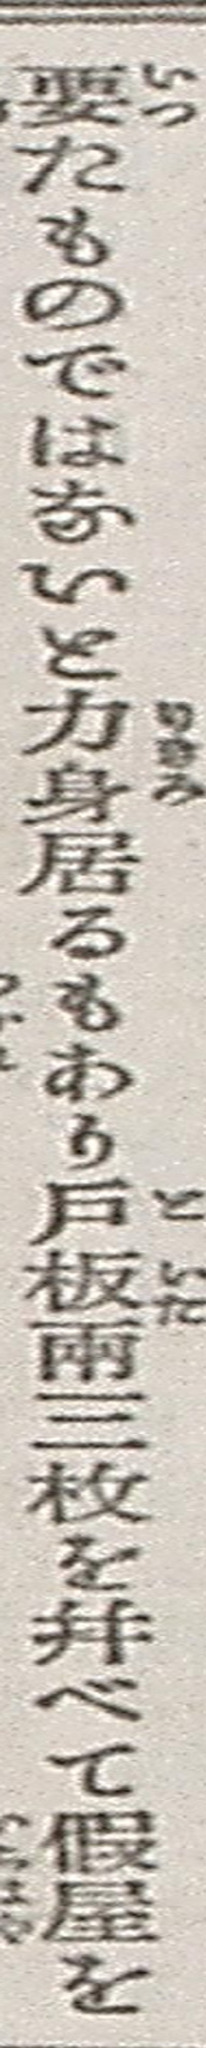要たものではないと力身居るもあり戸板両三枚を并べて仮屋を
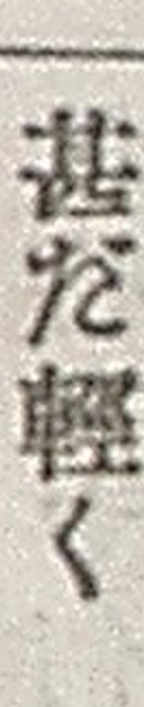甚だ軽く
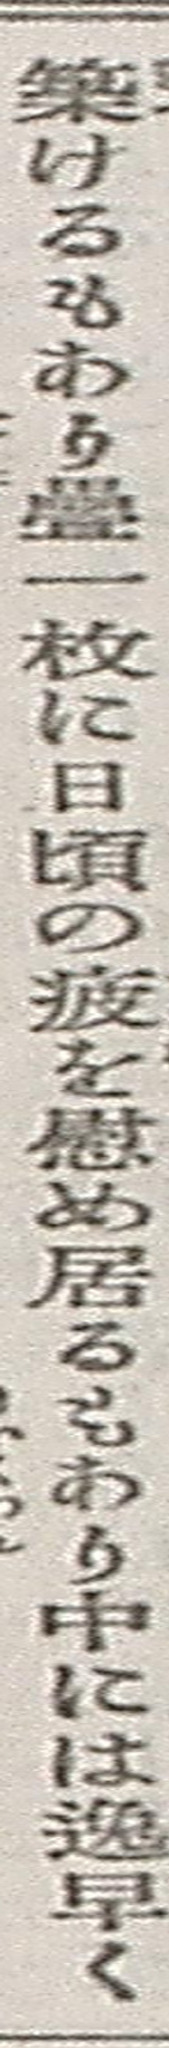築けるもあり畳一枚に日頃の疲を慰め居るもあり中には逸早く
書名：風俗畫報臨時増刊第百十九號　大海嘯被害録（中）
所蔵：東京大学地震研究所図書室 Earthquake Research Institute Library, The University of Tokyo, JAPAN
